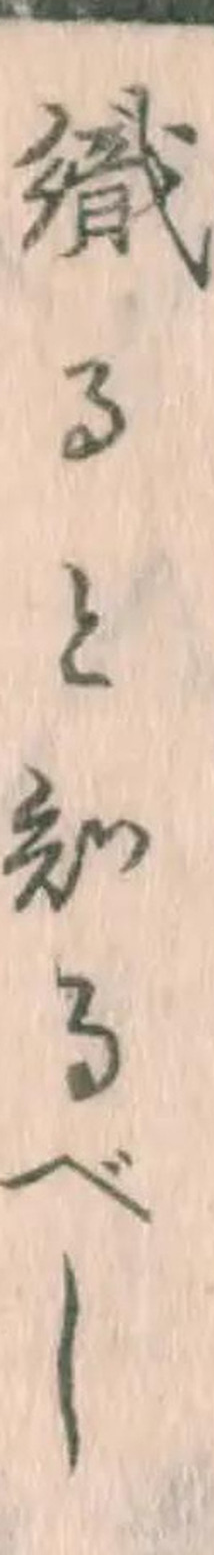織ると知るべし
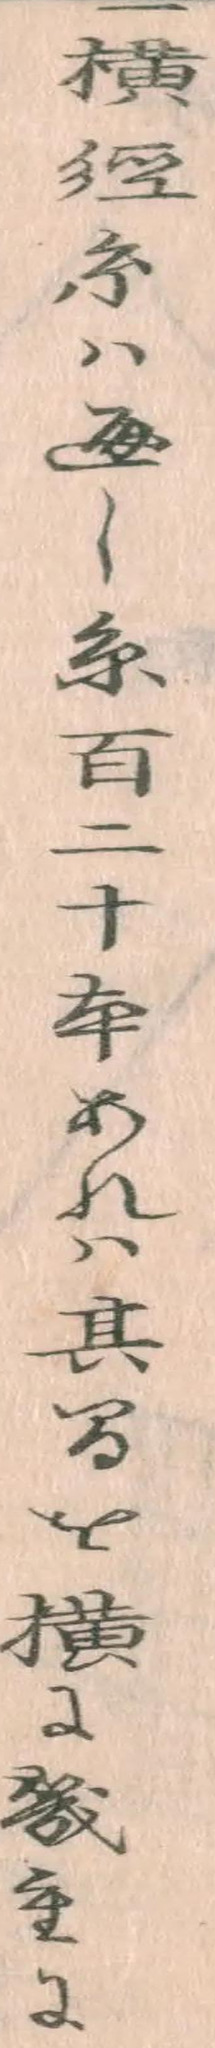一横経糸は通し糸百二十本あれは其間を横に幾重に
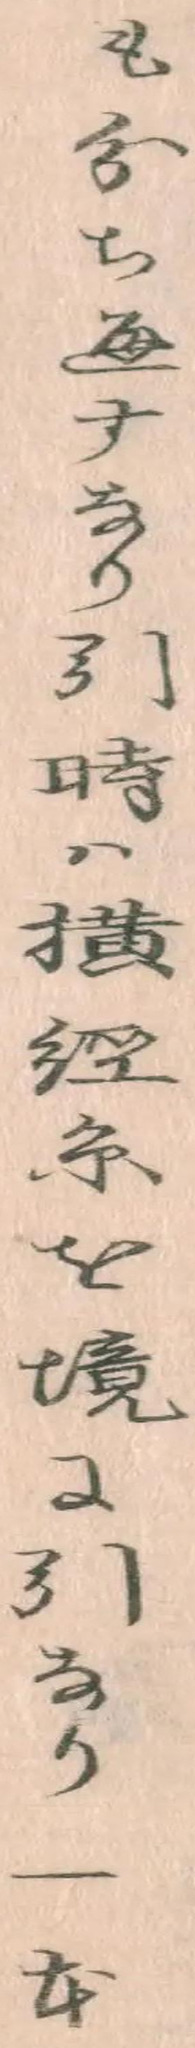も分ち通すなり引時は横経糸を境に引なり一本
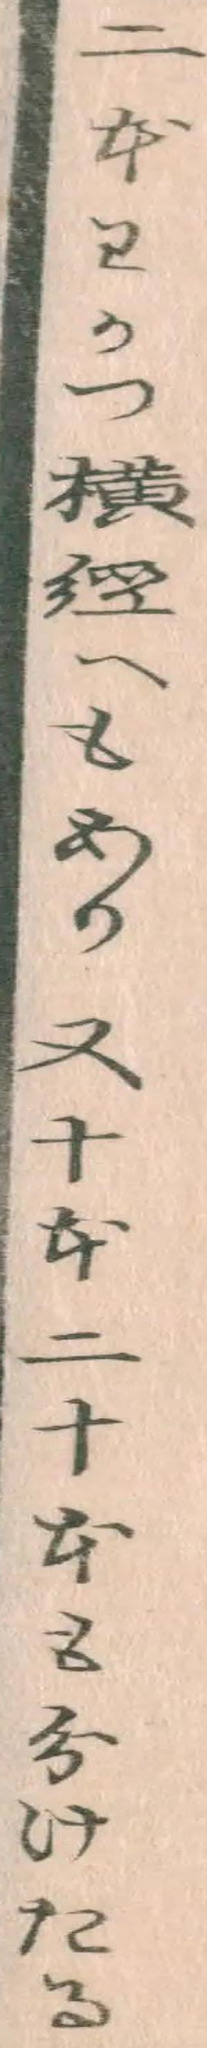二本わかつ横経へもあり又十本二十本も分けたる
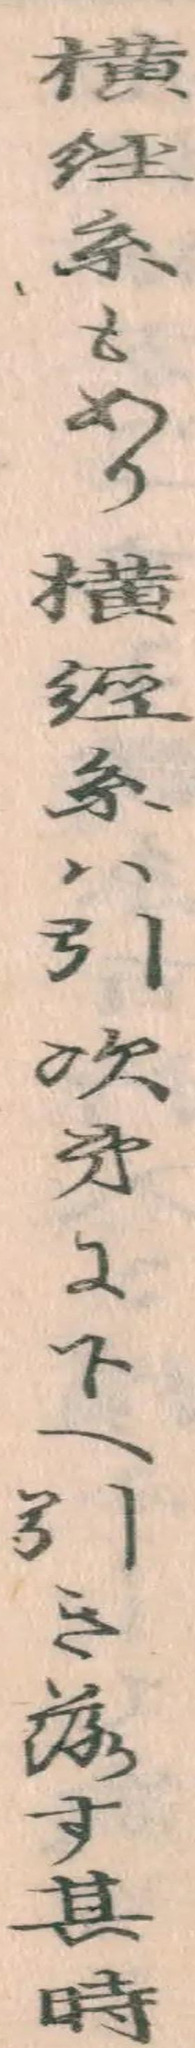横経糸もあり横経糸は引次第に下へ引き落す其時
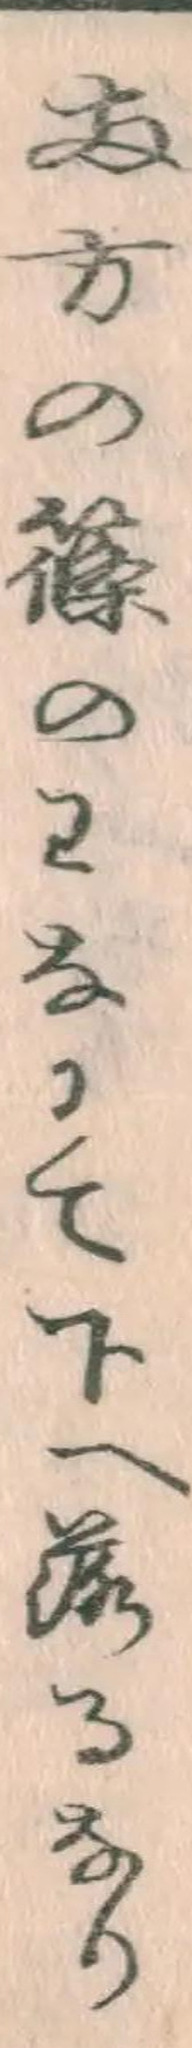両方の篠のわなにて下へ落るなり
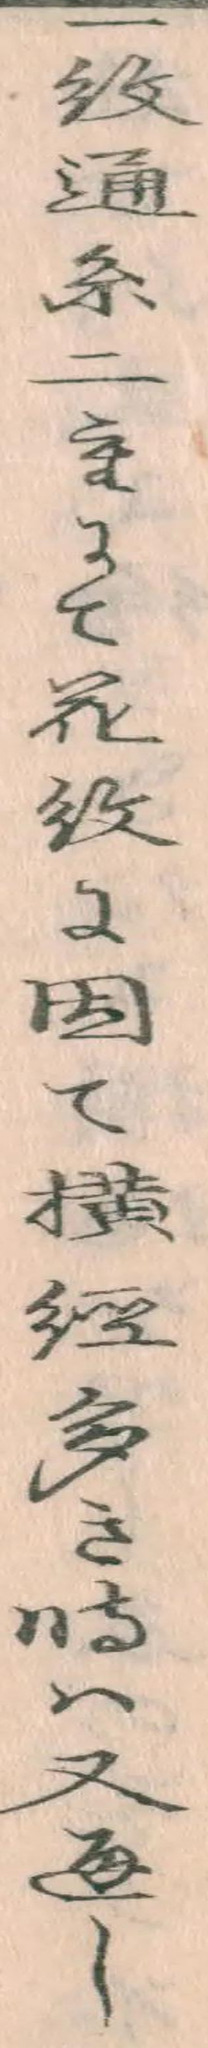一紋通糸二重にて花紋に因て横経多き時は又通し
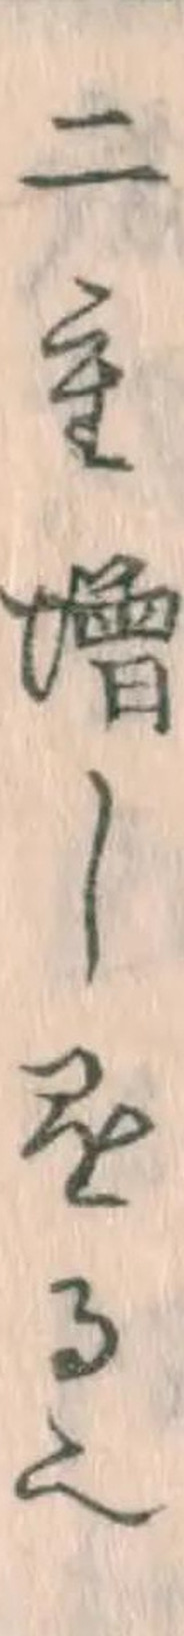二重増し懸る也
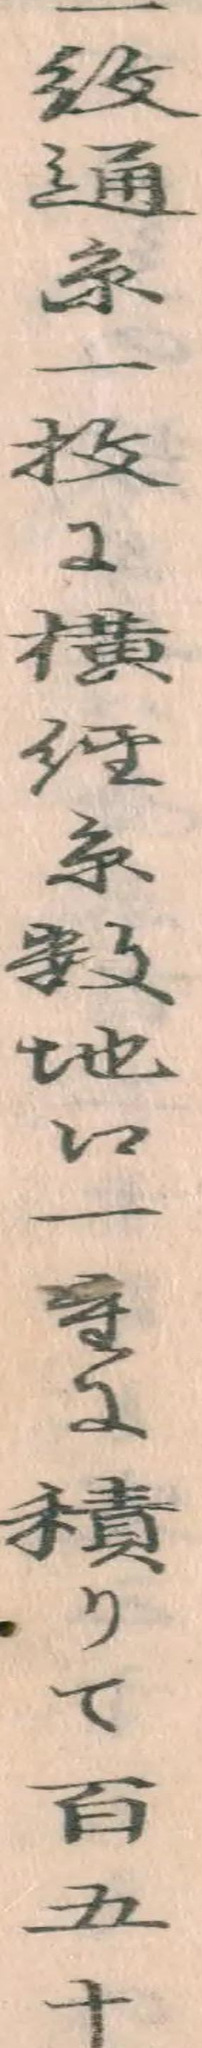一紋通糸一枚に横経糸数地口一重に積りて百五十
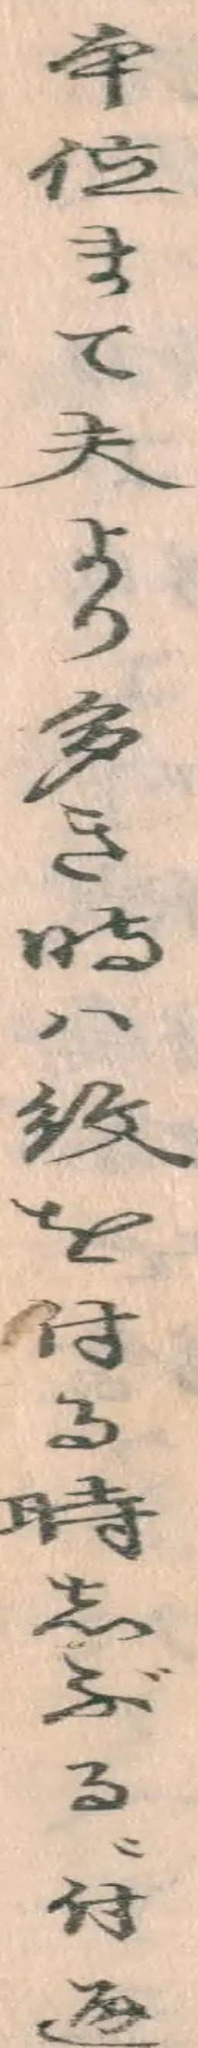本位まて夫より多き時は紋を付る時しぶるに付通
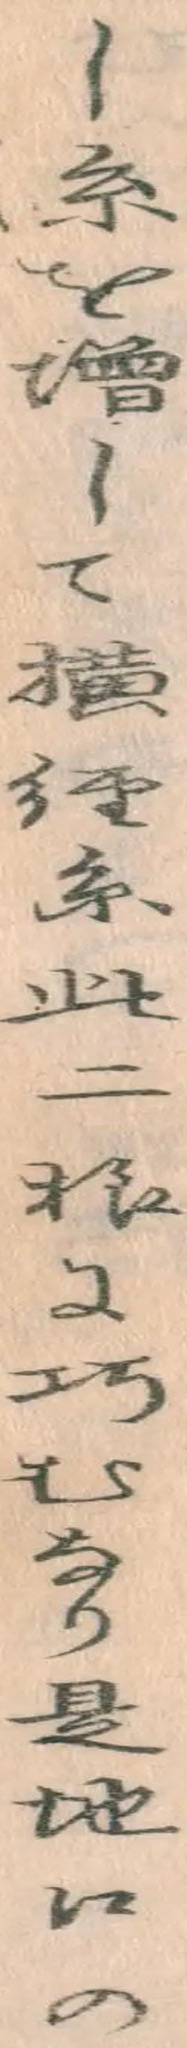し糸を増して横経糸此二様に巧むなり是地口の
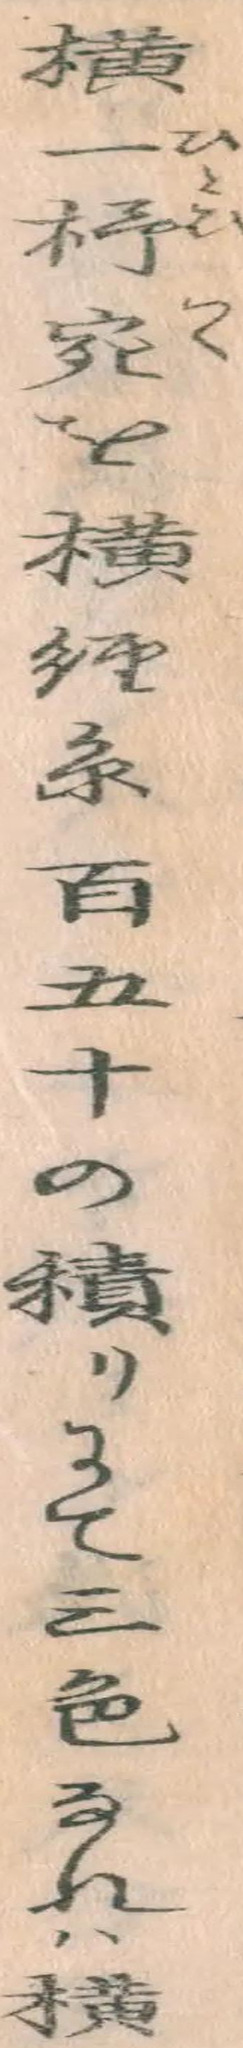横一杼宛を横経糸百五十の積りにて三色なれは横
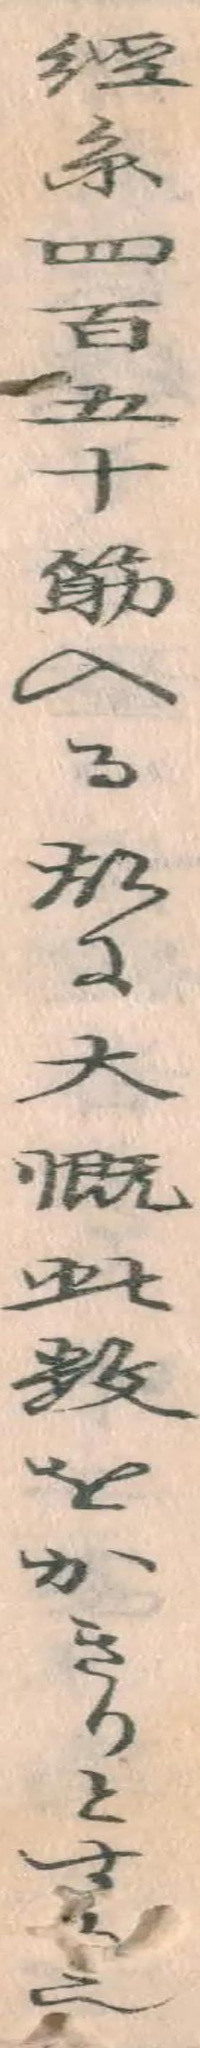経糸四百五十筋入る故に大慨此数をかきりとする也
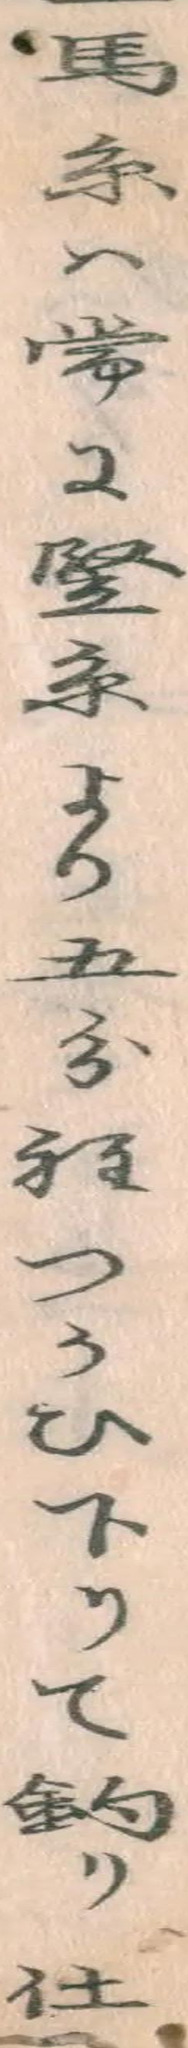一馬糸は常に竪糸より五分程つかひ下りて釣り仕
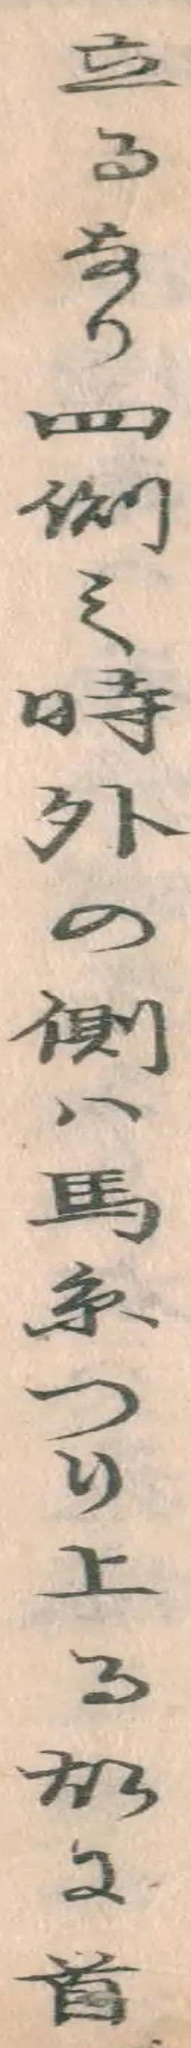立るなり四側之時外の側は馬糸つり上る故に首
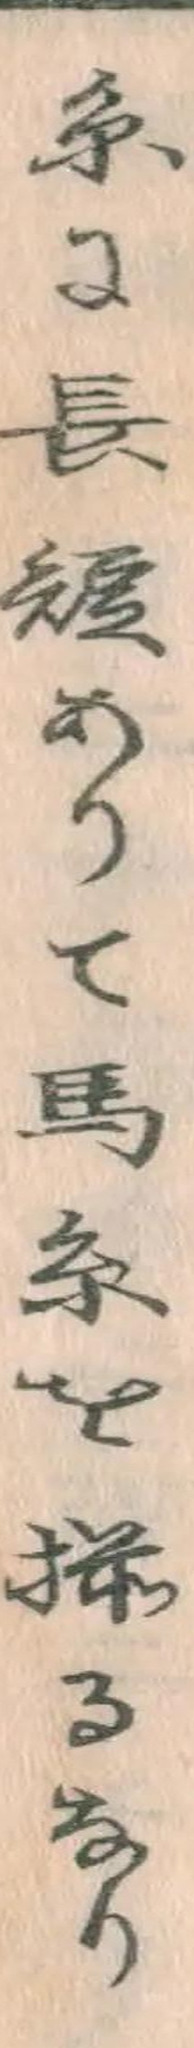糸に長短ありて馬糸を揃るなり
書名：機織彙編 5巻. [2]
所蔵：国立国会図書館 National Diet Library, JAPAN
